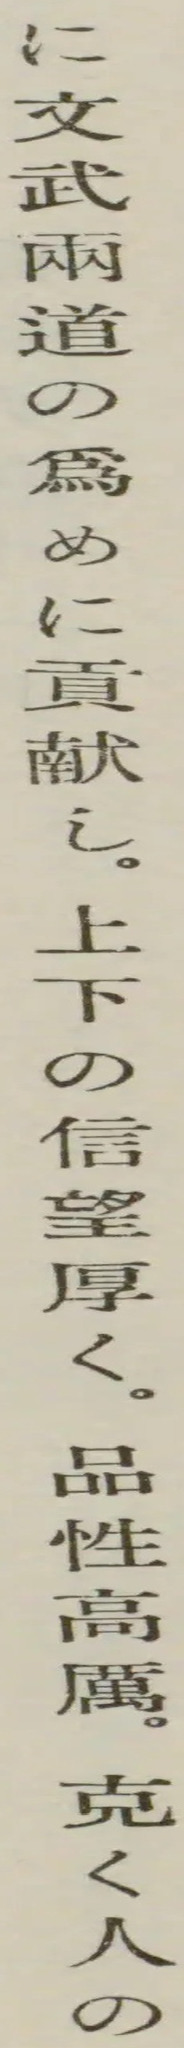に文武両道の為めに貢献し、上下の信望厚く。品性高厲。克く人の
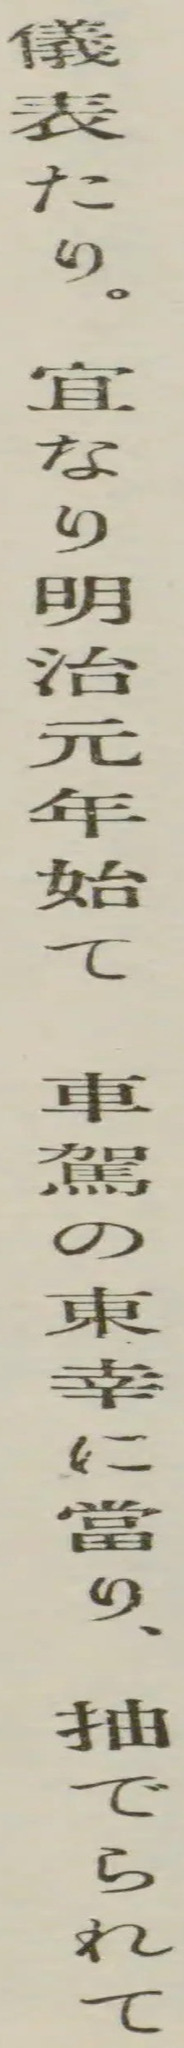儀表たり。宜なり明治元年始て車駕の東幸に当たり、抽でられて
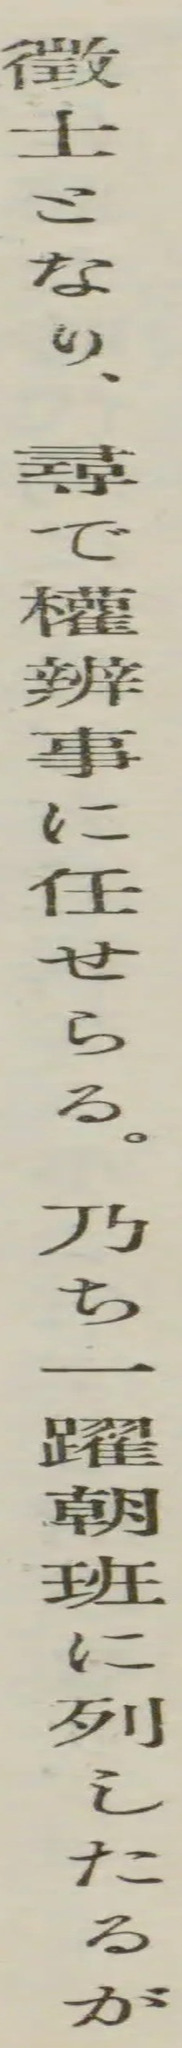徴士となり、尋で権弁事に任せらる。乃ち一躍朝班に列したるが
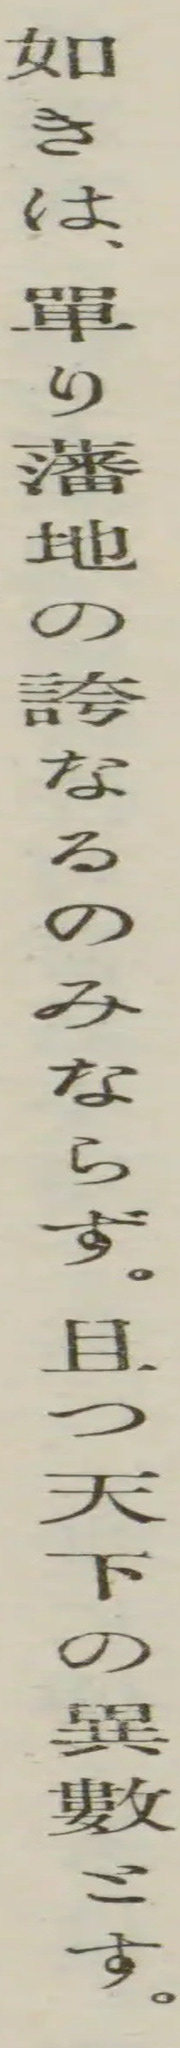如きは、単り藩地の誇なるのみならず。且つ天下の異数とす。
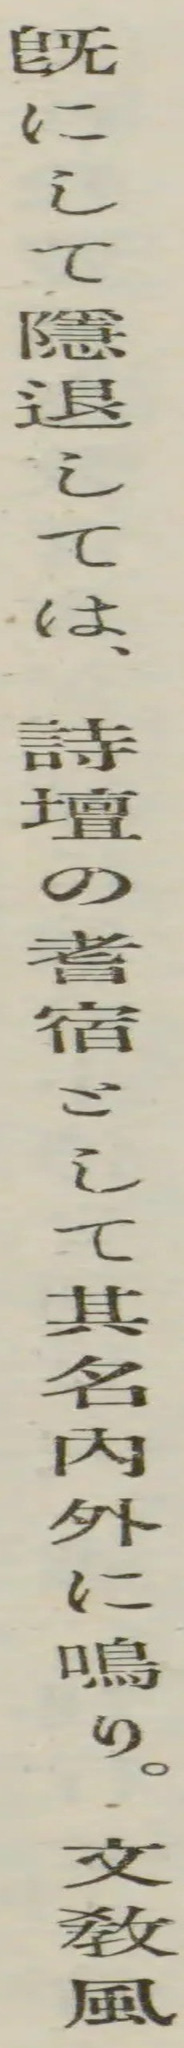既にして隠退しては、詩壇の耆宿として其名内外に鳴り。文教風
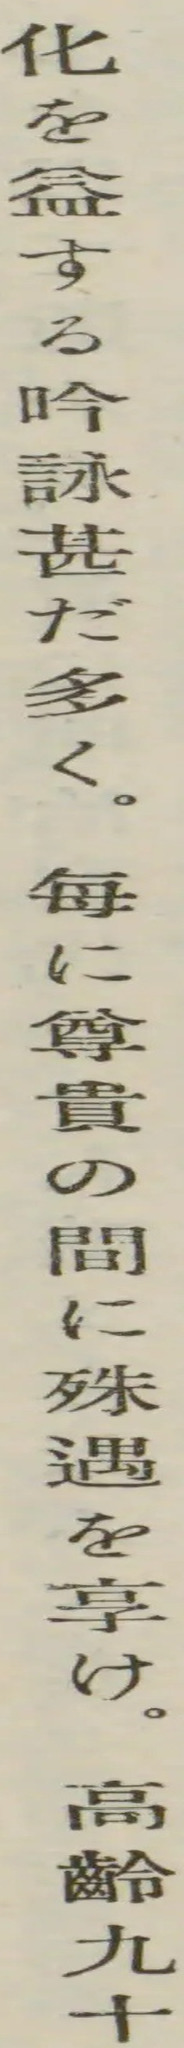化を益する吟詠甚だ多く。毎に尊貴の間に殊遇を享け。高齢九十

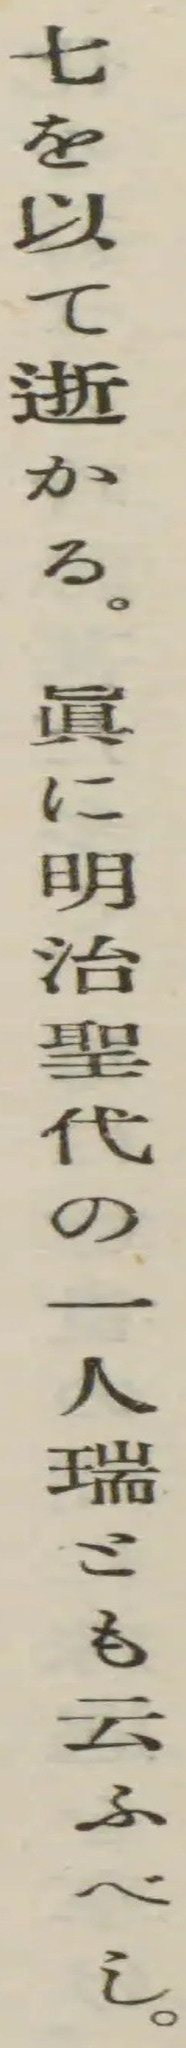七を以て逝かる。真に明治聖代の一人瑞とも云ふべし。
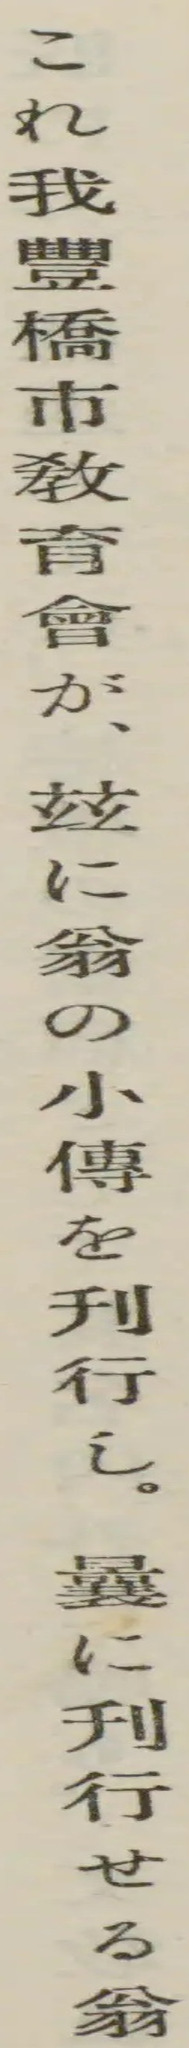これ我豊橋市教育会が、茲に翁の小伝を刊行し。曩に刊行せる翁
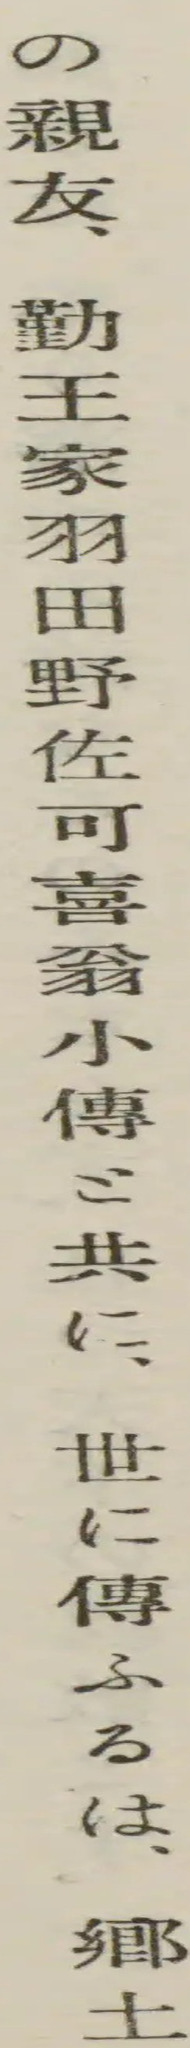の親友、勤王家羽田野佐可喜翁小伝と共に世に伝ふるは、郷土
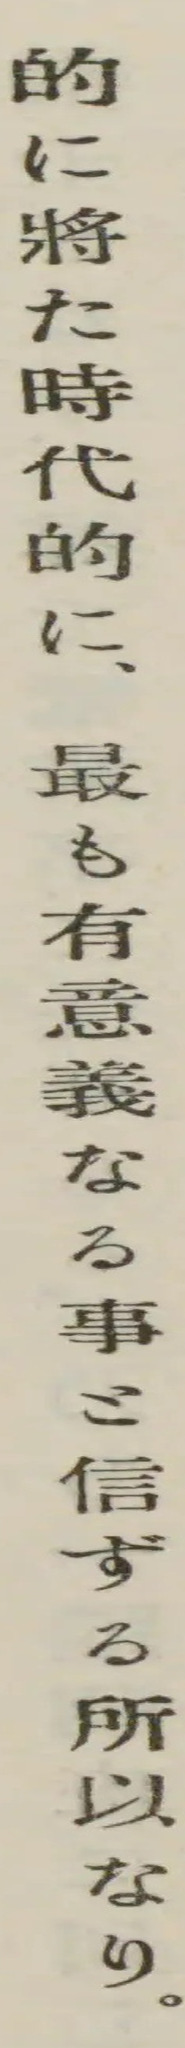的に将た時代的に、最も有意義なる事と信ずる所以なり。
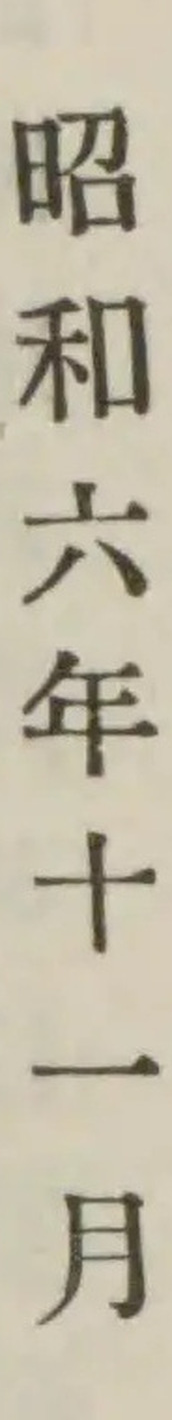昭和六年十一月
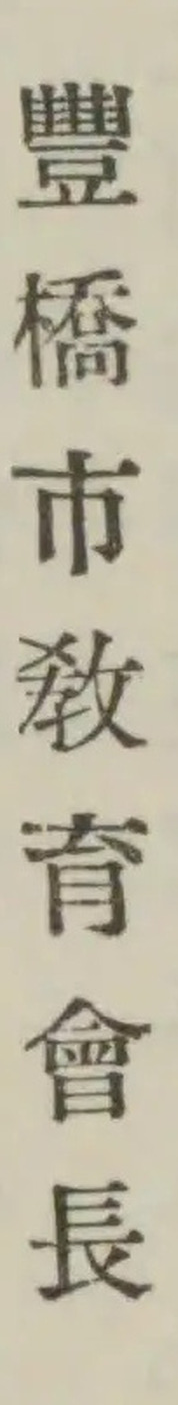豊橋市教育会編
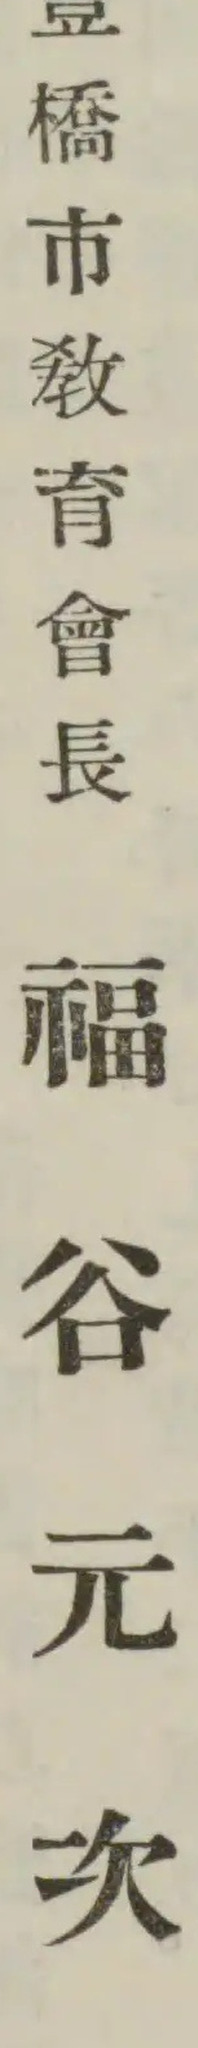豊橋市教育会長福谷元次
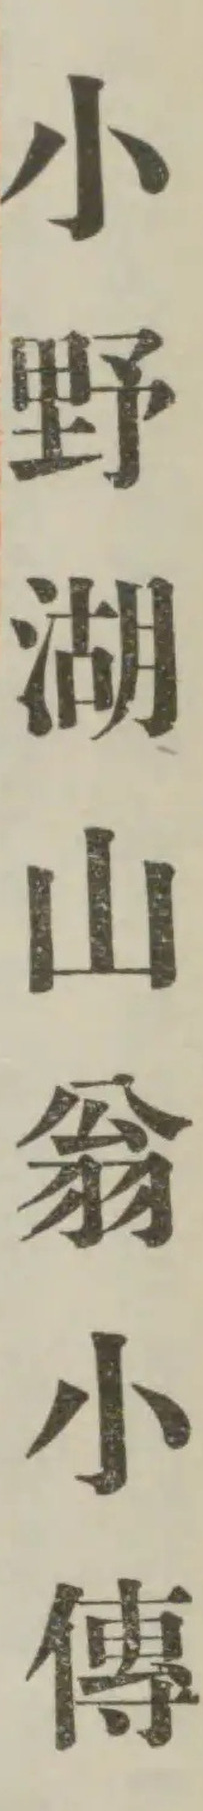小野湖山翁小伝
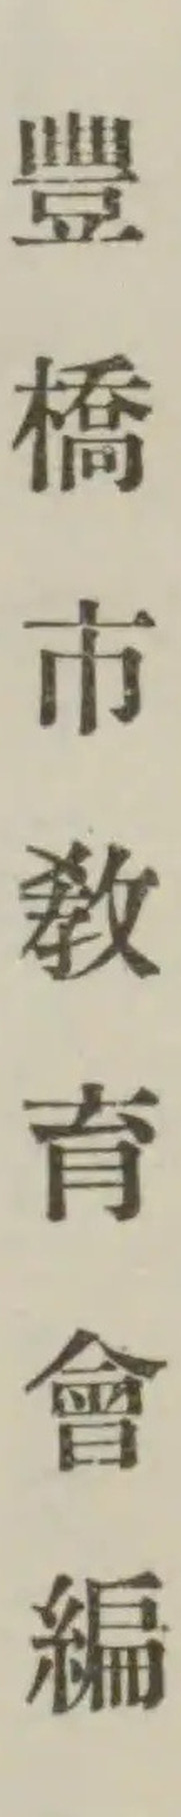豊橋市教育会編
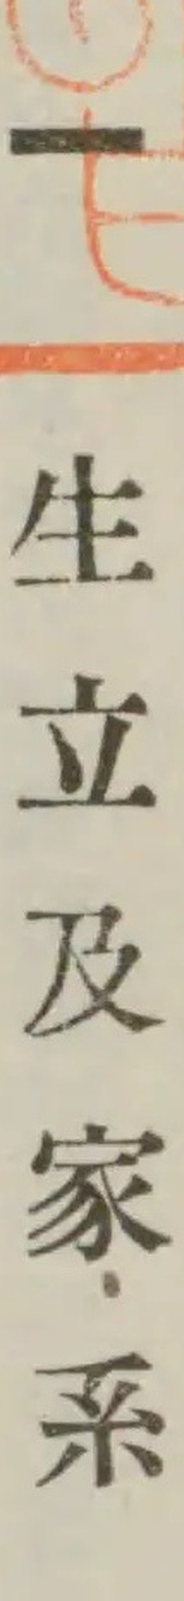一生立及家系
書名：小野湖山翁小伝
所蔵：国立国会図書館 National Diet Library, JAPAN
